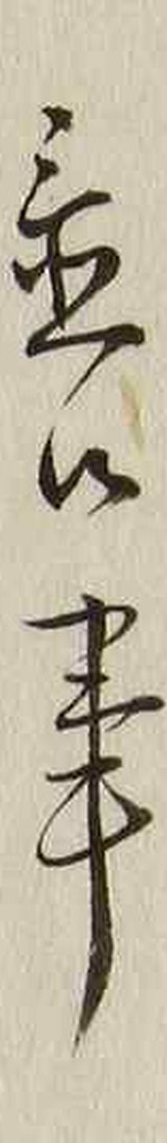置候事
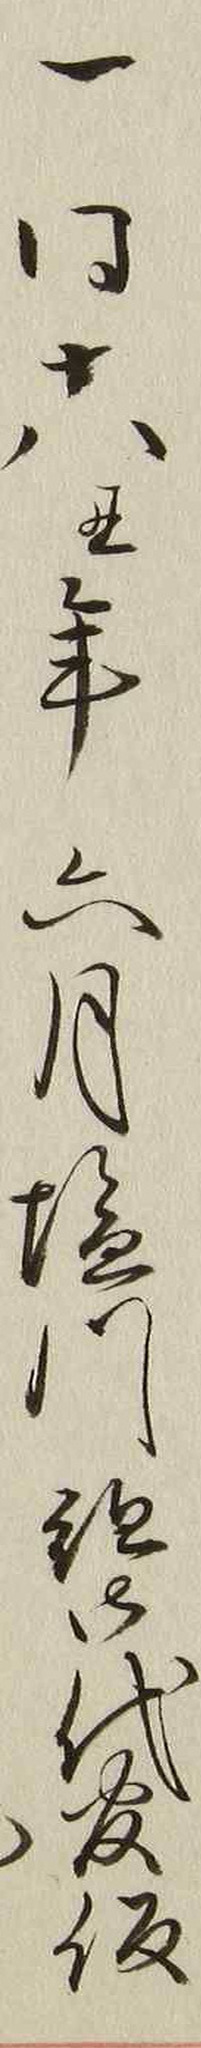一同十八丑年六月塩川組御代官仮
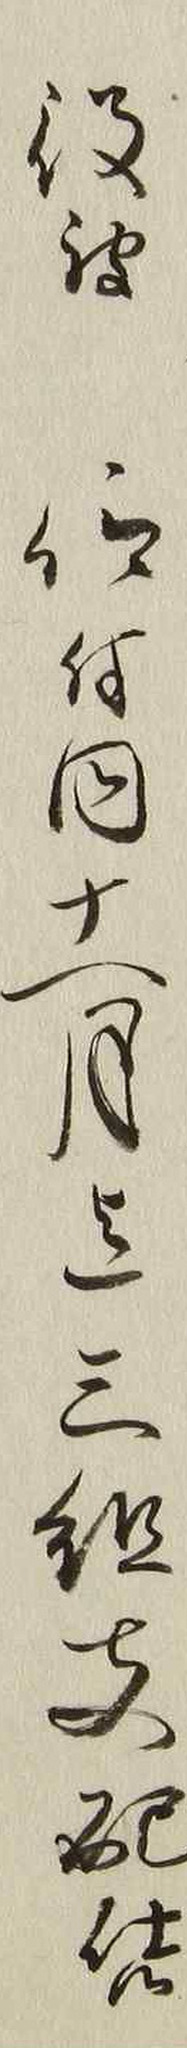役被仰付同十一月迄三組支配仕候
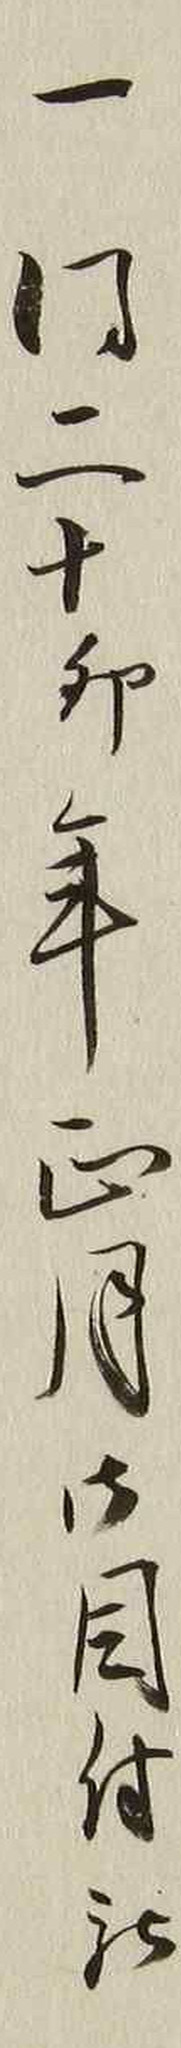一同二十卯年正月御目付被
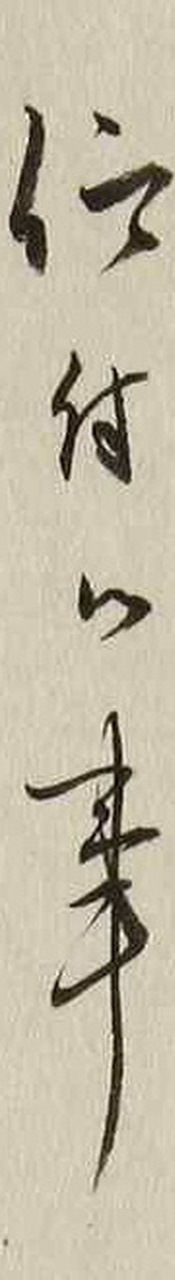仰付候事
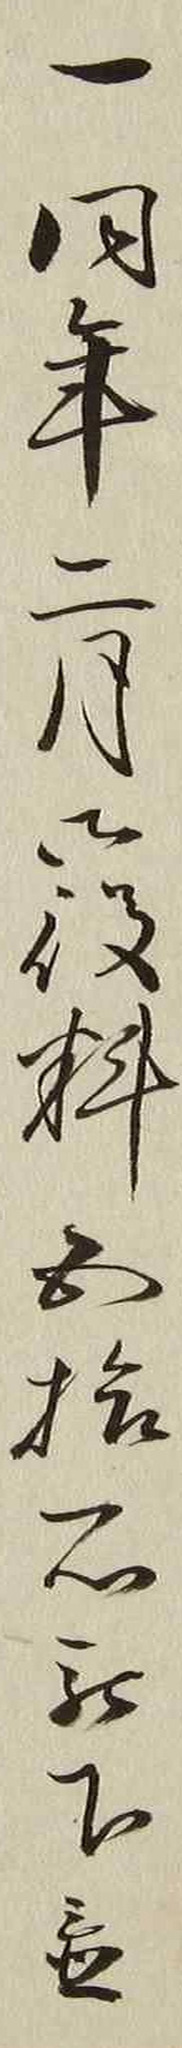一同年二月御役料五拾石被下置
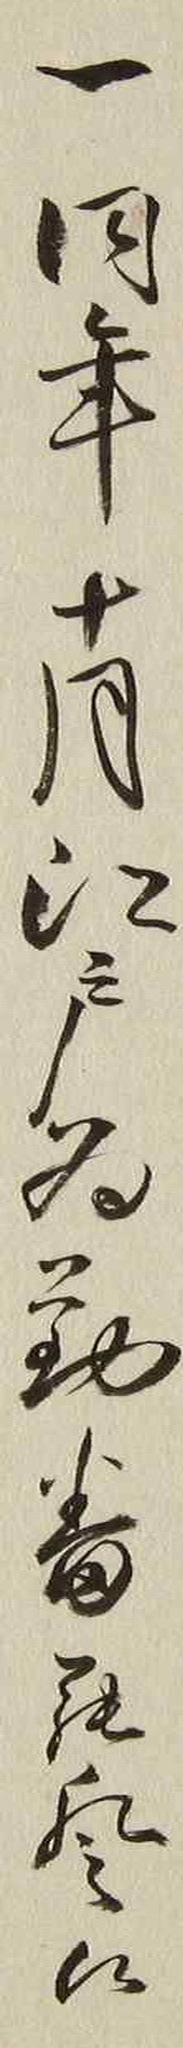一同年十月江戸為勤番罷登候
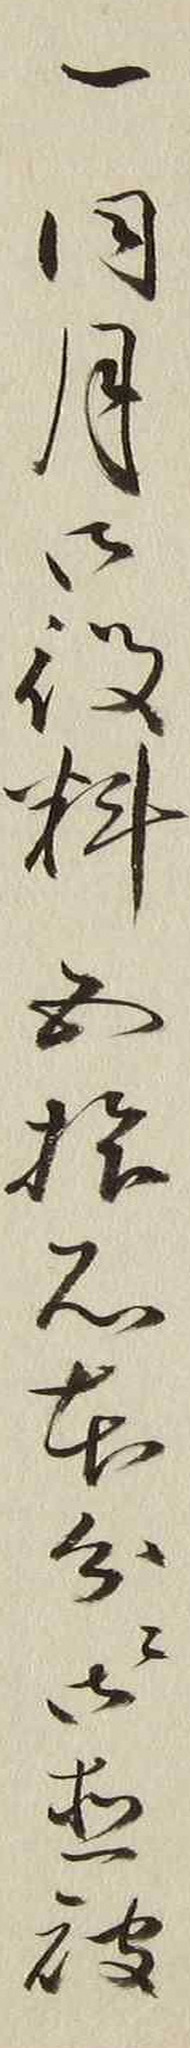一同月御役料五拾石本分ニ御直被
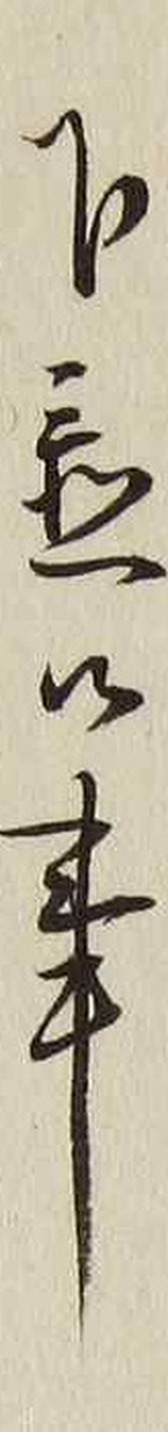下置候事
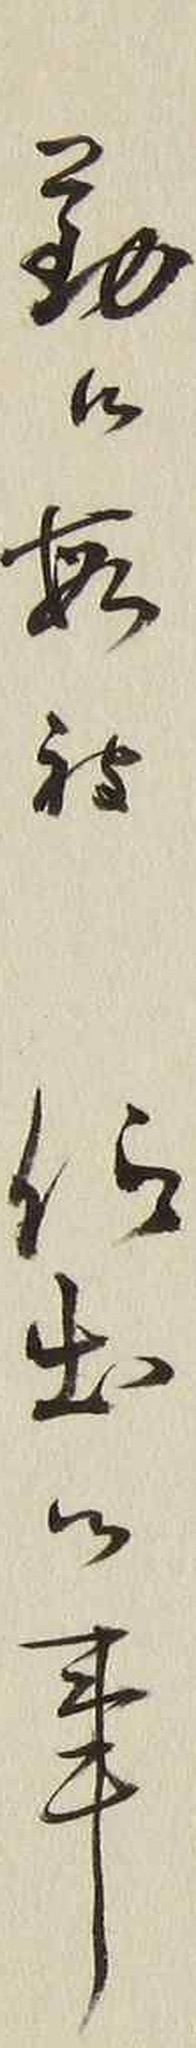勤候段被仰出候事
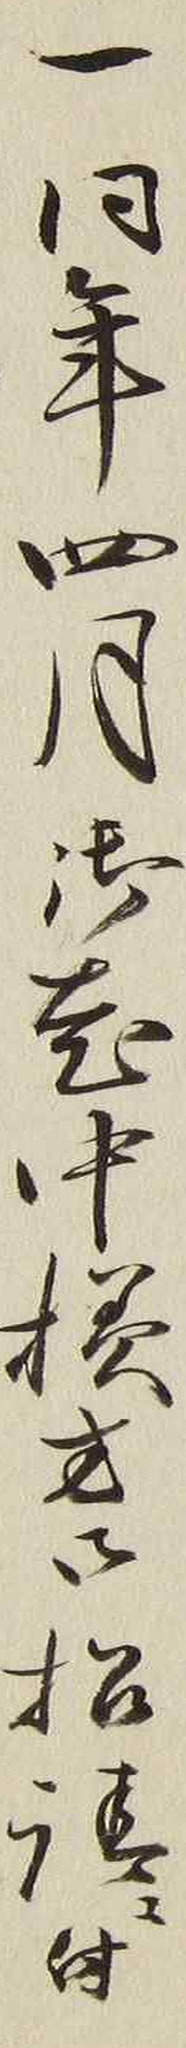一同年四月御老中様方御招請ニ付
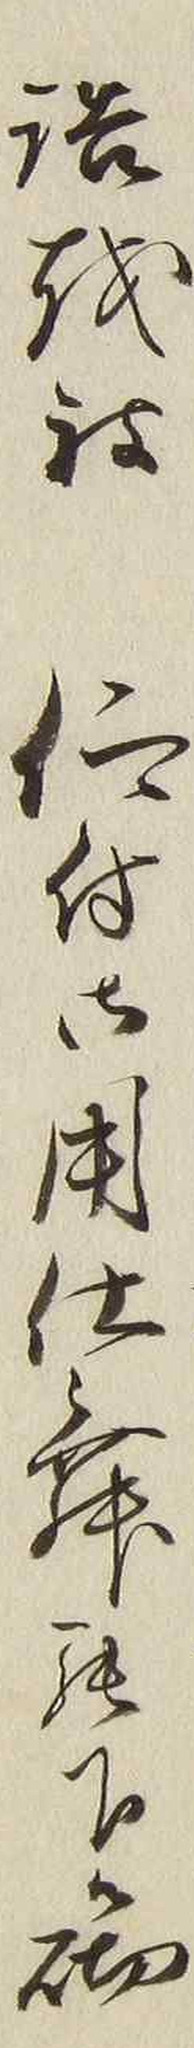詰越被仰付御用仕舞罷下候砌

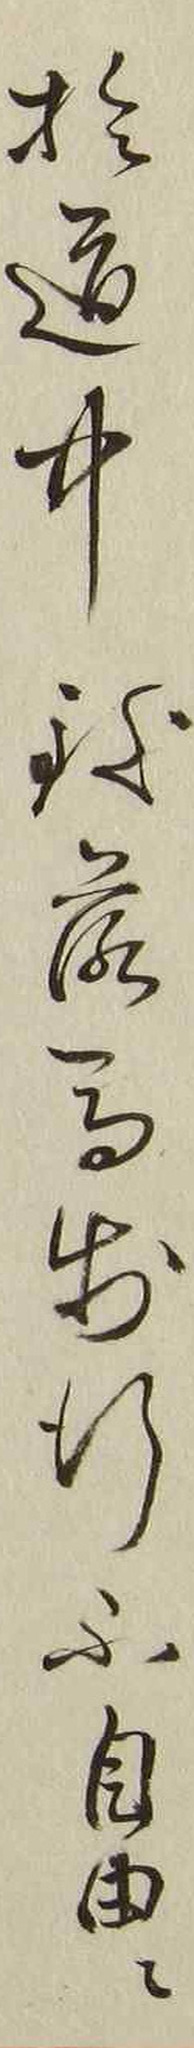於道中致落馬歩行不自由ニ
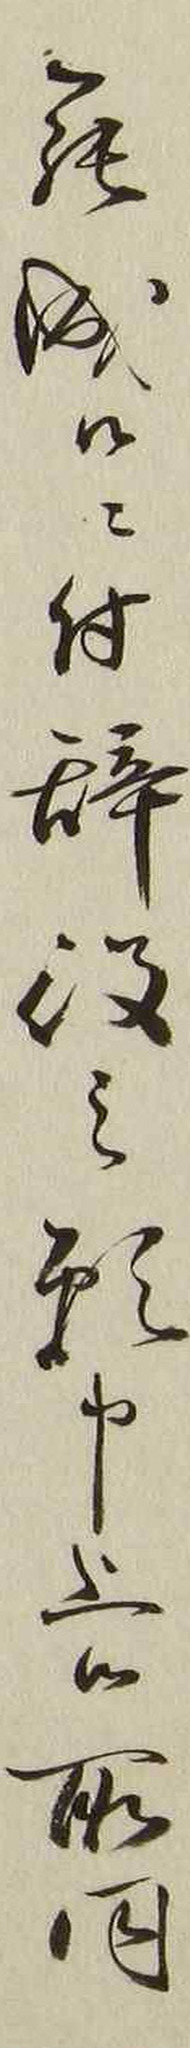罷成候ニ付辞役之願申上候所同
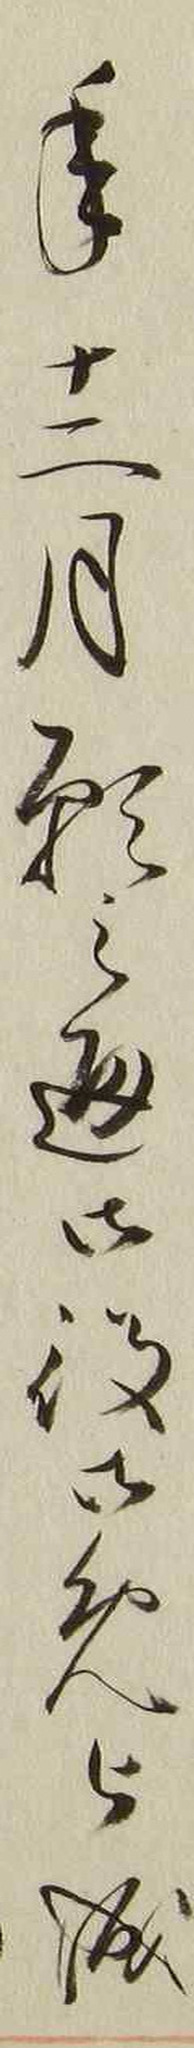年十二月願之通御役御免被成
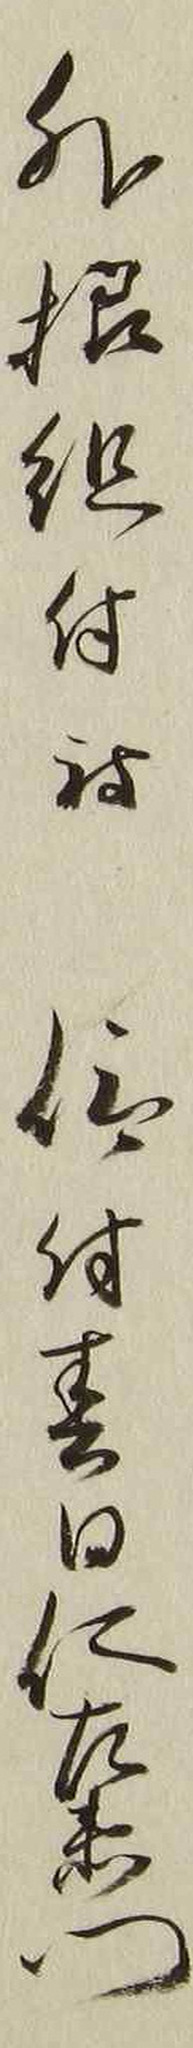外様組付被仰付春日仁左衛門
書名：諸士系譜　巻之163　な之部5
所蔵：会津若松市立会津図書館
